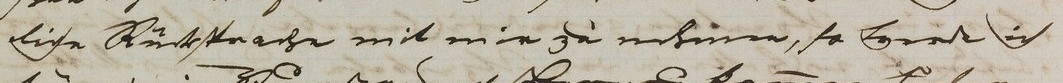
liche Rücksprache mit mir zu nehmen, so werde ich
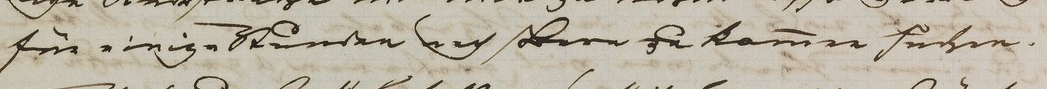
für einige Stunden nach Bern zu kommen suchen.
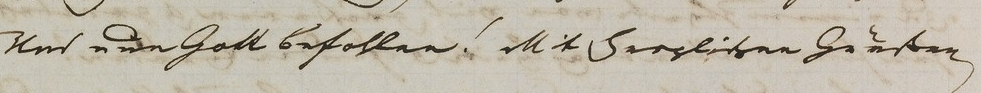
Und nun Gott befohlen! Mit herzlichen Grüßen
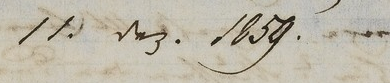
11. Dez. 1859.
